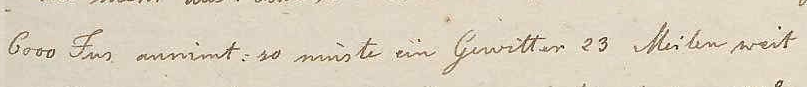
6000 Fus annimt: so müste ein Gewitter 23 Meilen weit
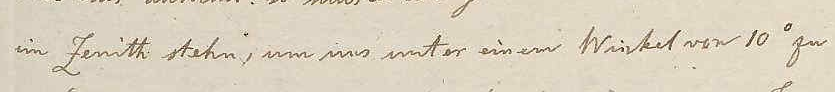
im Zenith stehn, um uns unter einem Winkel von 10° zu
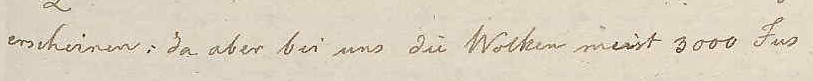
erscheinen: da aber bei uns die Wolken meist 3000 Fus
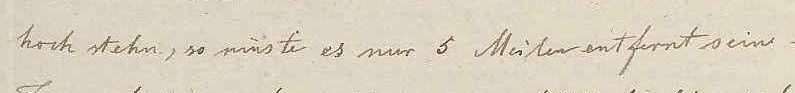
hoch stehn, so müste es nur 5 Meilen entfernt sein –
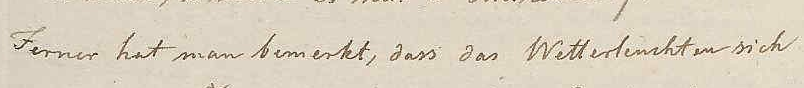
Ferner hat man bemerkt, dass das Wetterleuchten sich
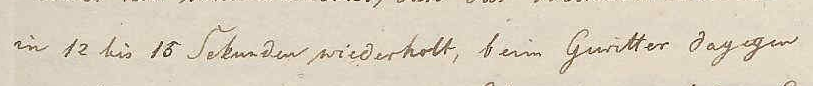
in 12 bis 15 Sekunden wiederholt, beim Gewitter dagegen
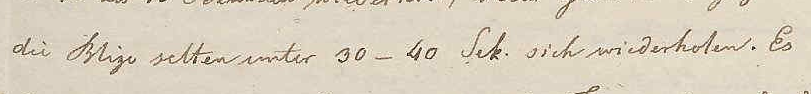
die Blize selten unter 30–40 Sek. sich wiederholen. Es
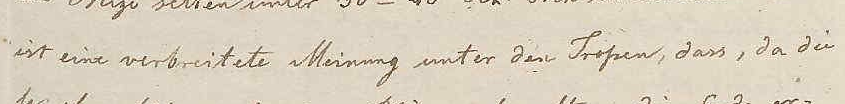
ist eine verbreitete Meinung unter den Tropen, dass, da die
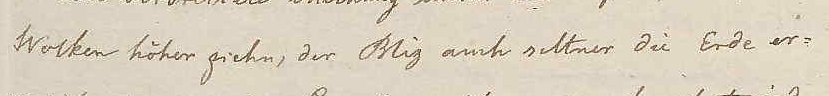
Wolken höher ziehn, der Bliz auch selten die Erde er-
